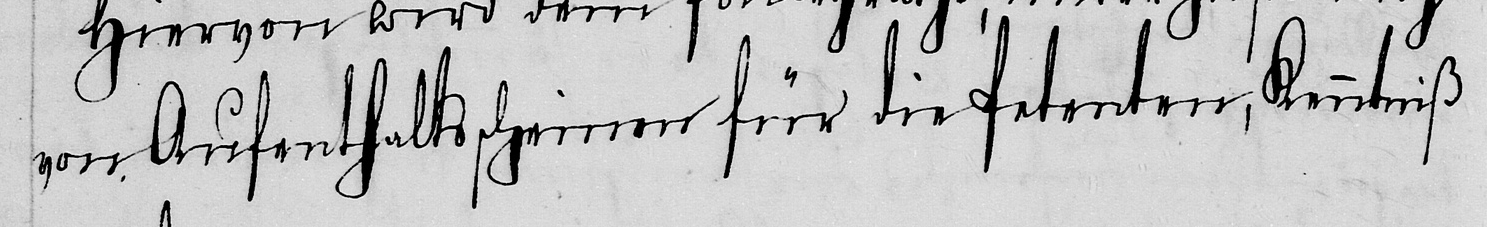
von Aufenthaltsscheinen für die Petenten, Kenntniß
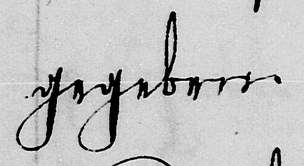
gegeben.
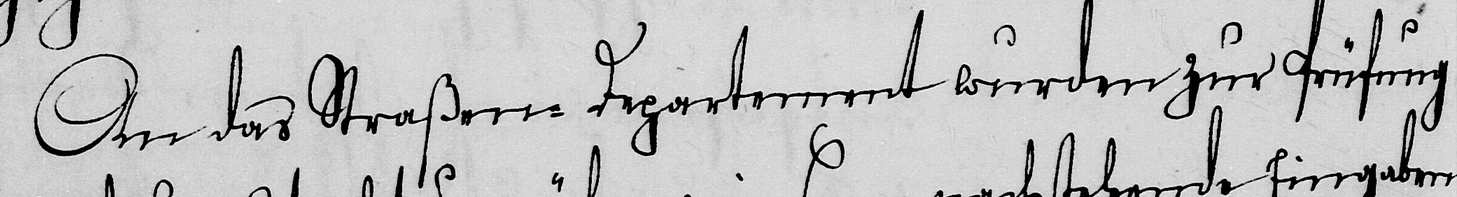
An das Straßen-Departement wurden zur Prüfung
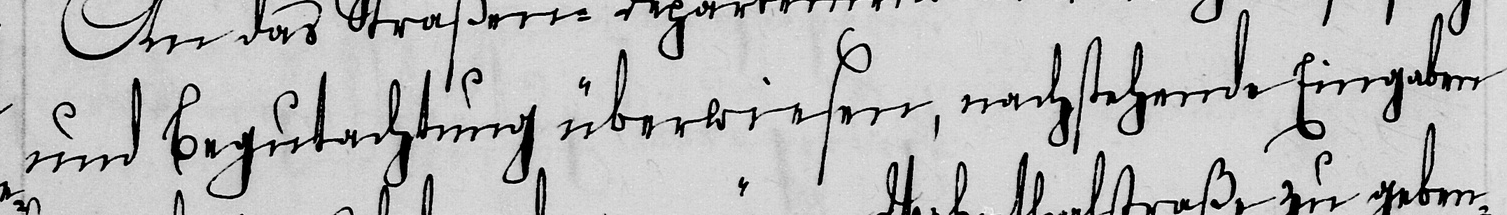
und Begutachtung überwiesen, nachstehende Eingaben
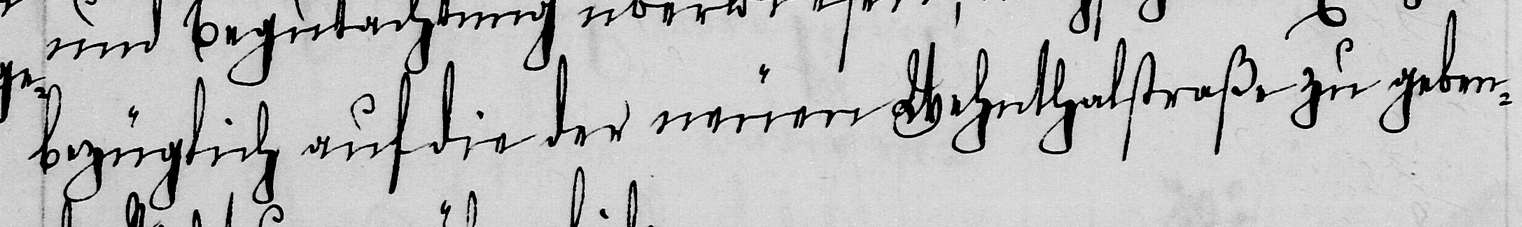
bezüglich auf die der neuen Wehnthalstraße zu geben¬
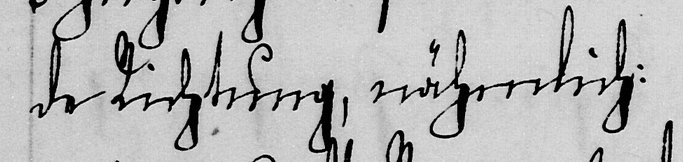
de Richtung, nähmlich:
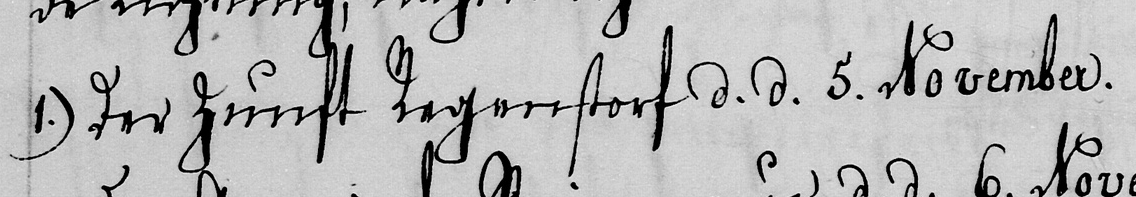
1.) Der Zunft Regenstorf d. d. 5. November.
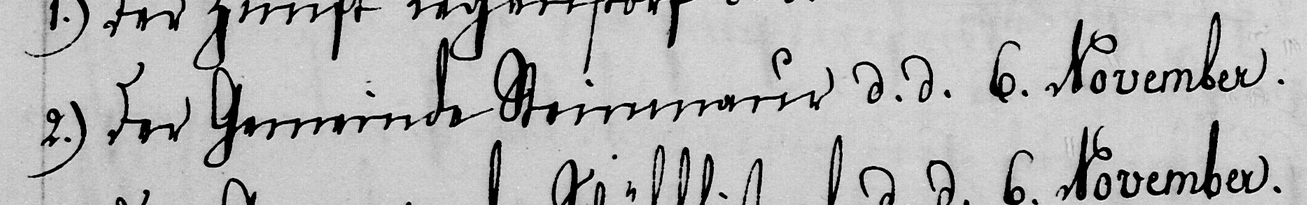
2.) Der Gemeinde Steinmaur d. d. 6. November.
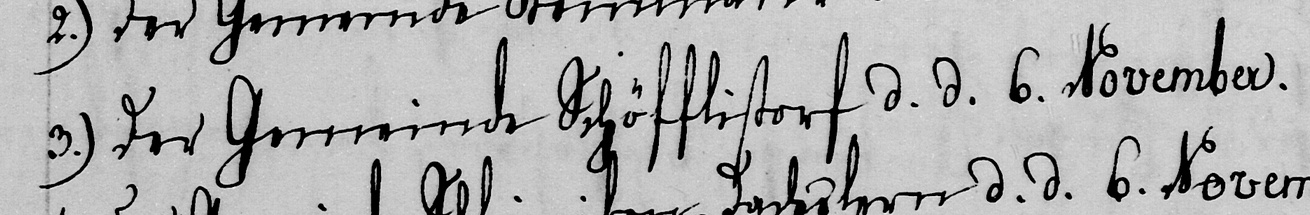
3.) Der Gemeinde Schöfflistorf d. d. 6. November.
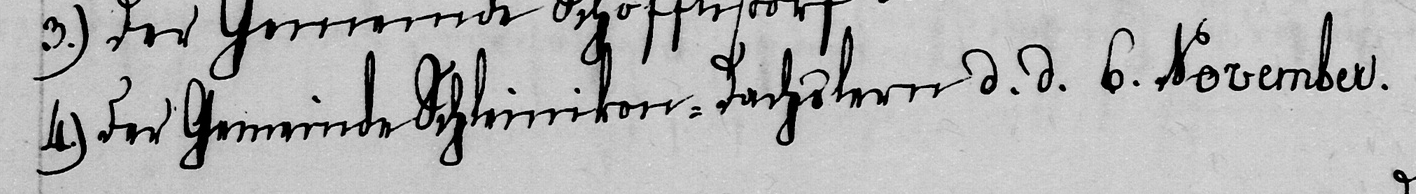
4.) Der Gemeinde Schleinikon-Dachslern d. d. 6. November.
